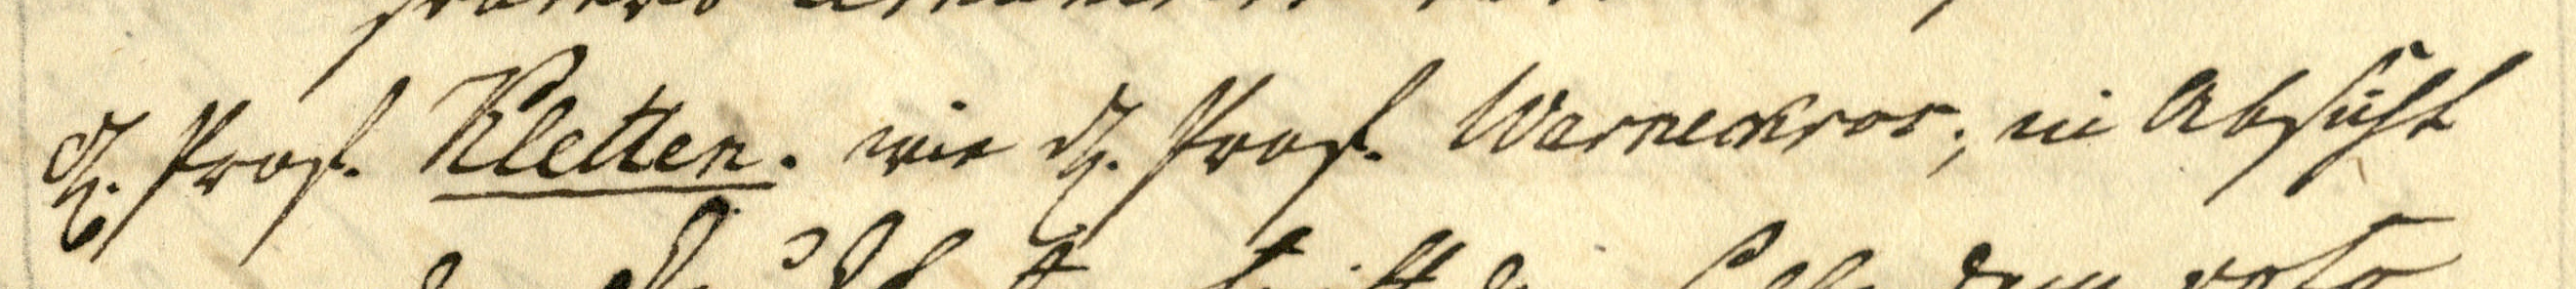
dh. Prof. Kletten. wie dh. Prof. Warneckros, in Absicht
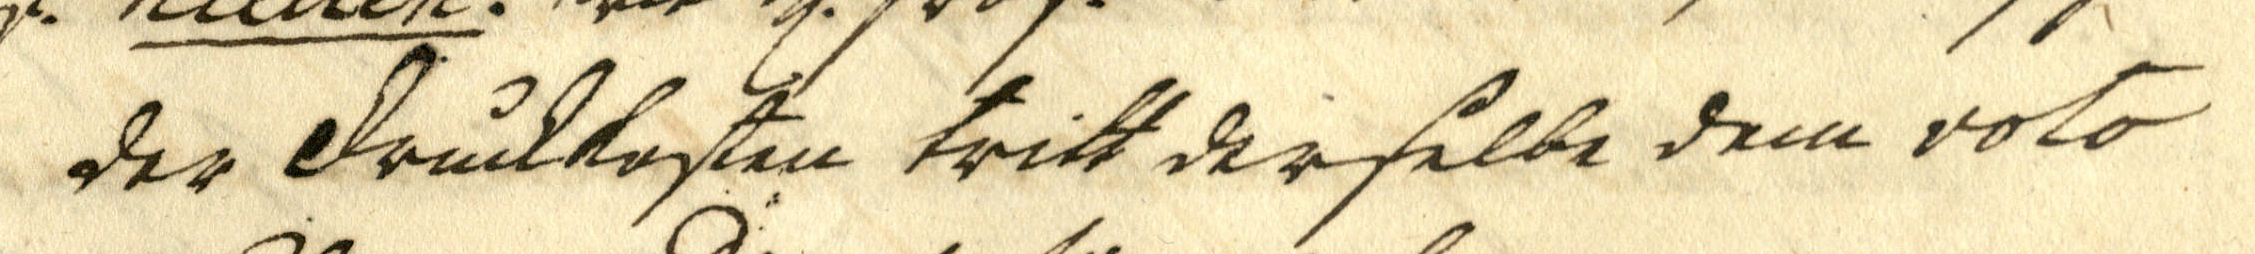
der Druckkosten tritt derselbe dem voto
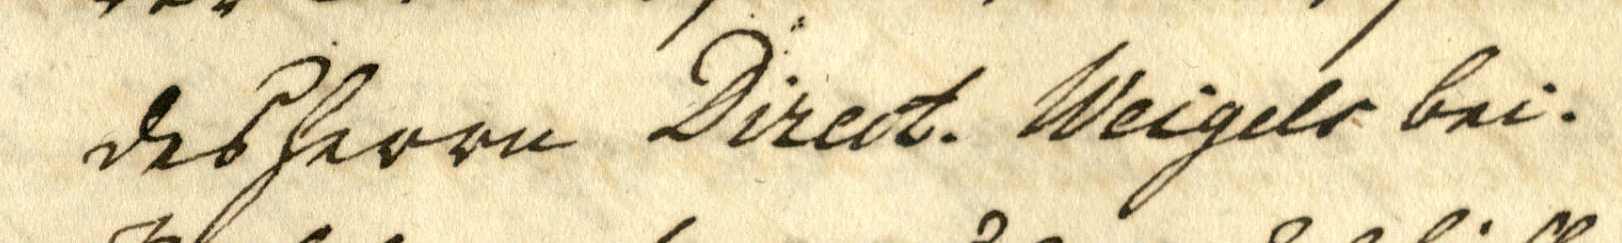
des Herrn Direct. Weigels bei.
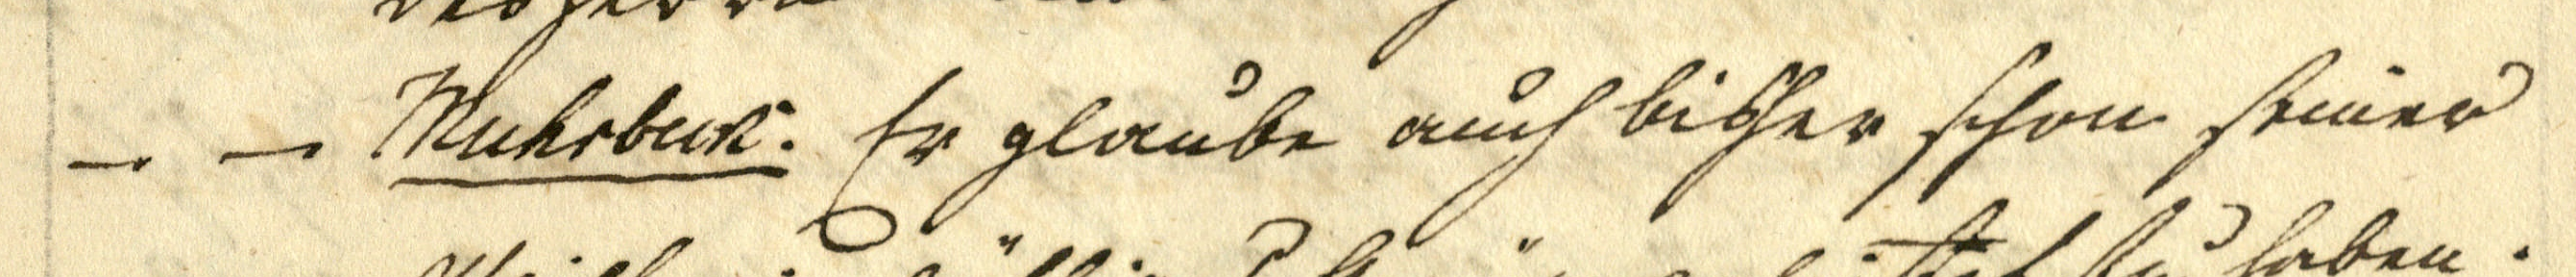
Muhrbeck. Er glaube auch bisher schon seiner
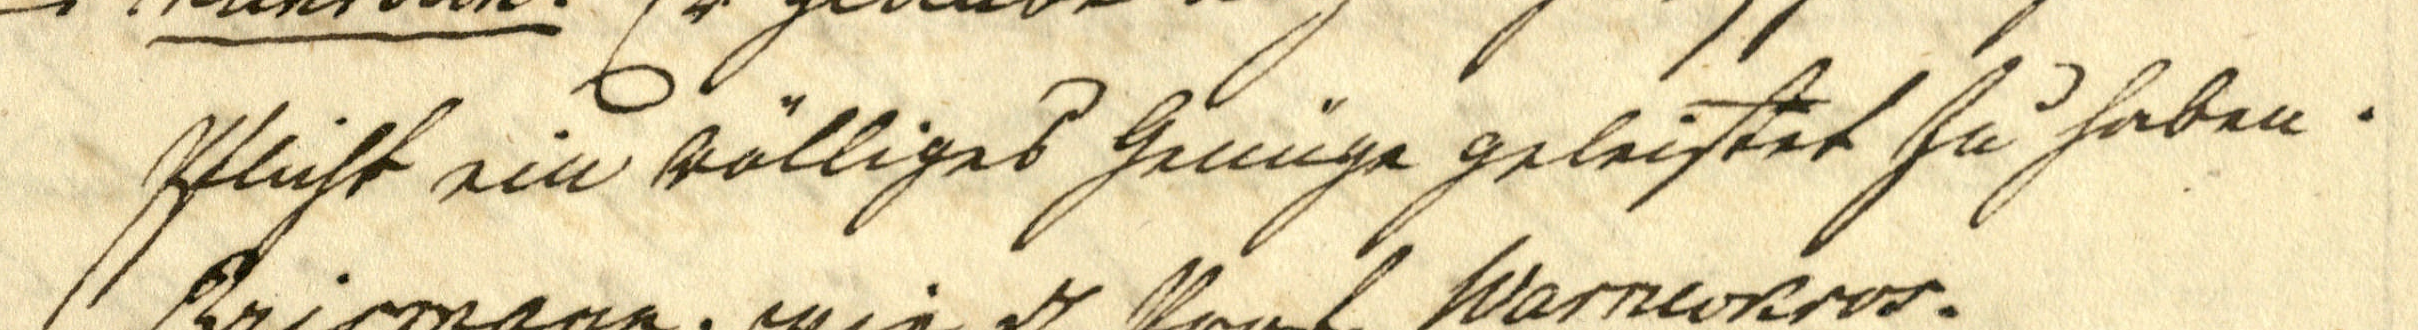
Pflicht ein völliges Genüge geleistet zu haben.
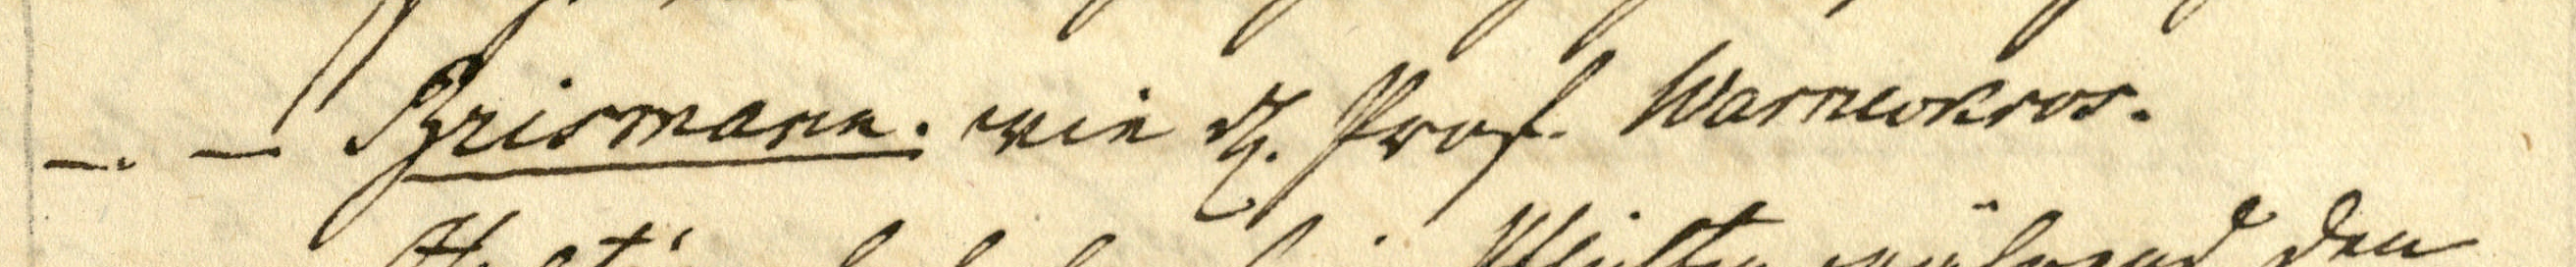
Brismann. wie dh. Prof. Warneckros.
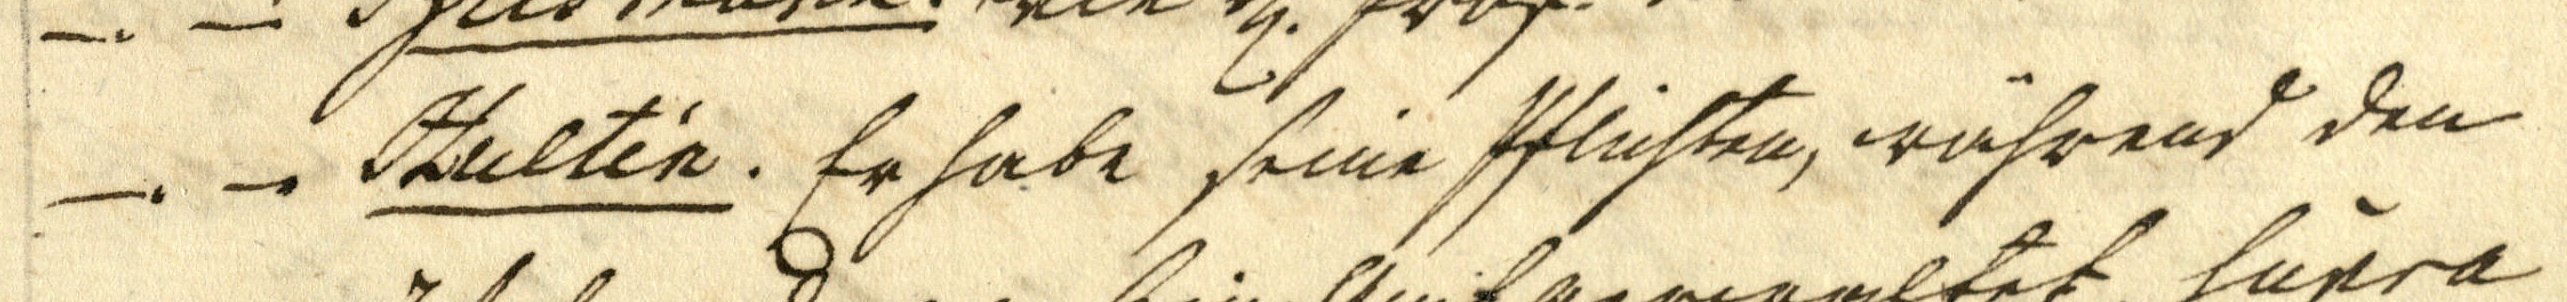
Hultén. Er habe seine Pflichten, während den
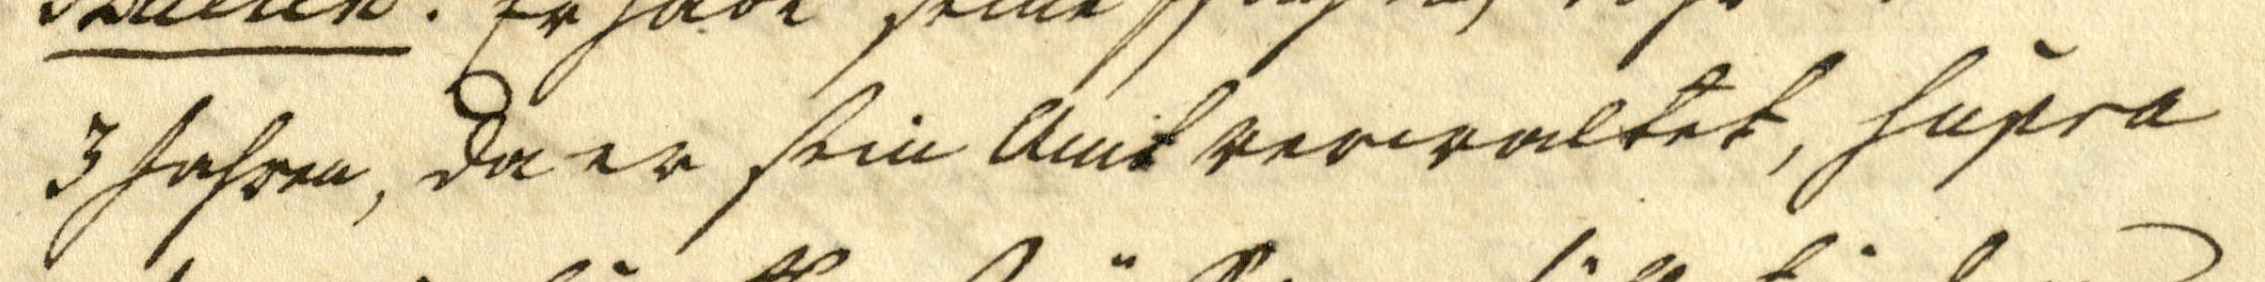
3 Jahren, da er sein Amt verwaltet, supra
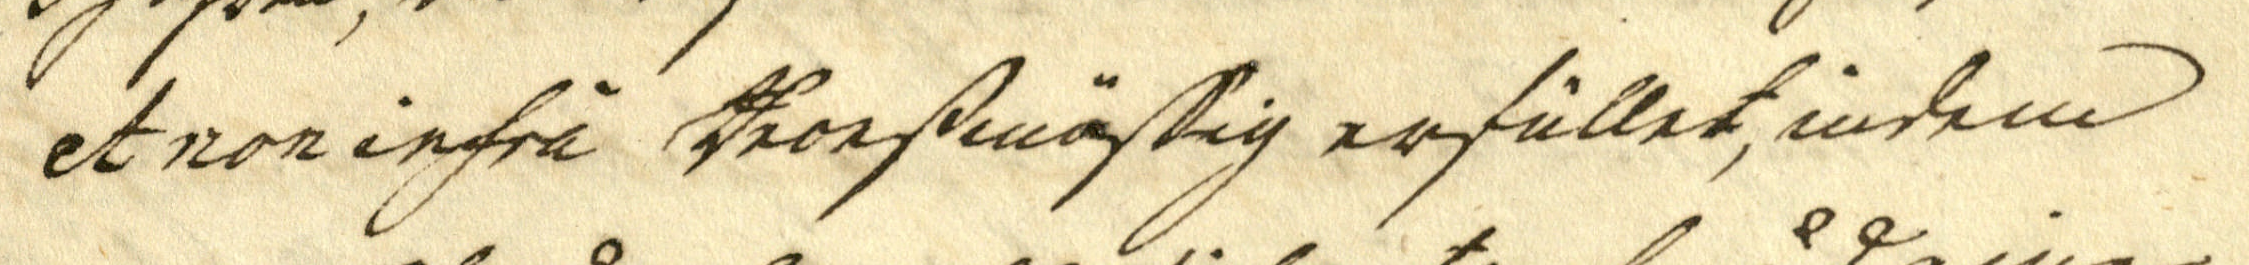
et non infra Receßmässig erfüllet, indem
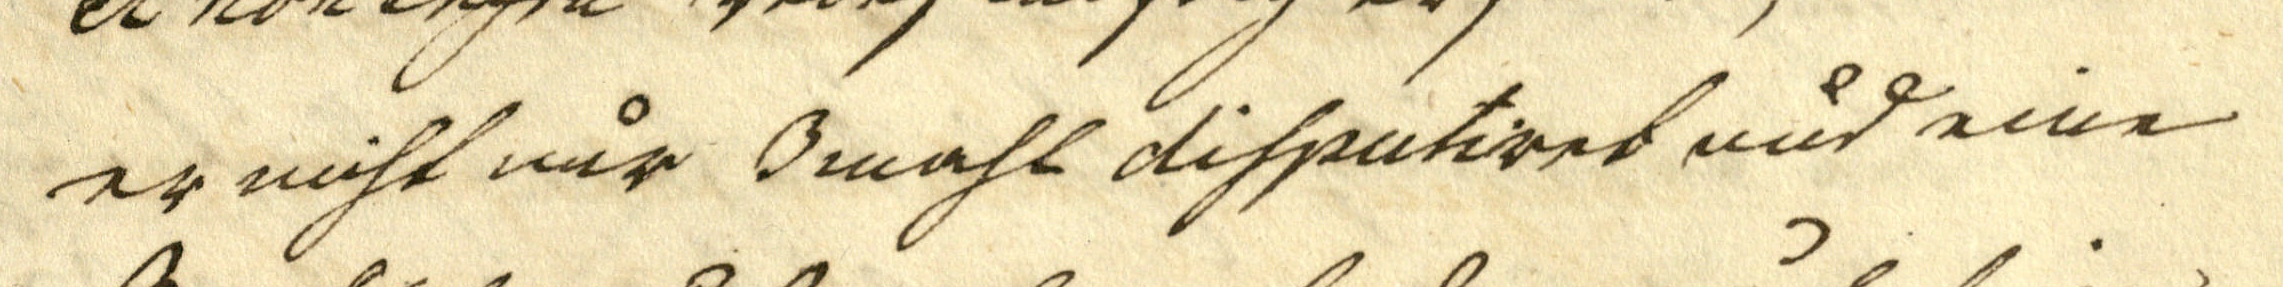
er nicht nur 3 mahl disputiret und eine
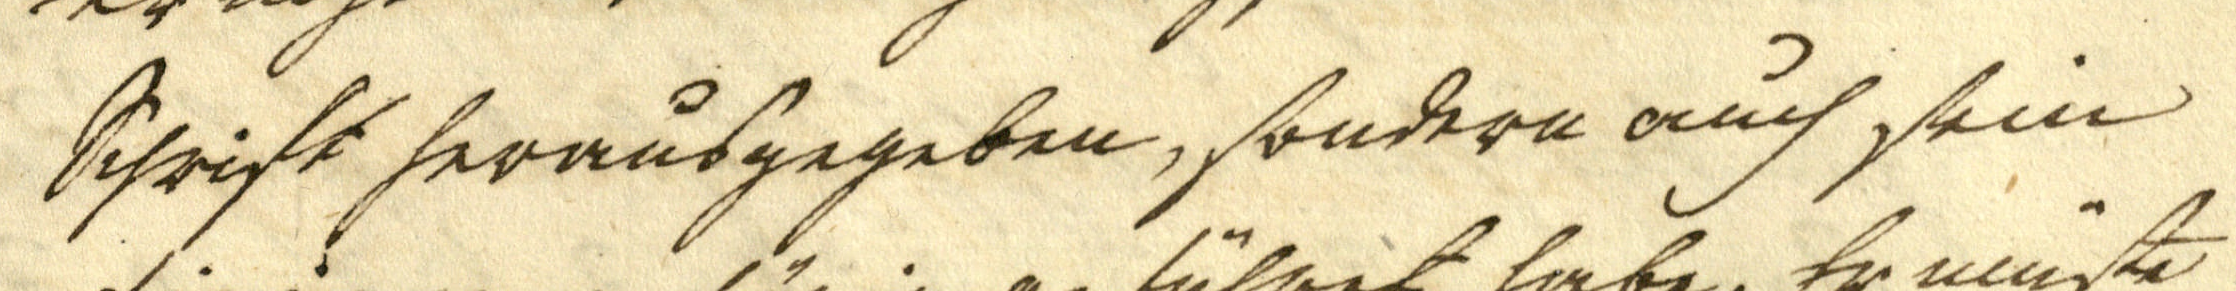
Schrift herausgegeben, sondern auch sein
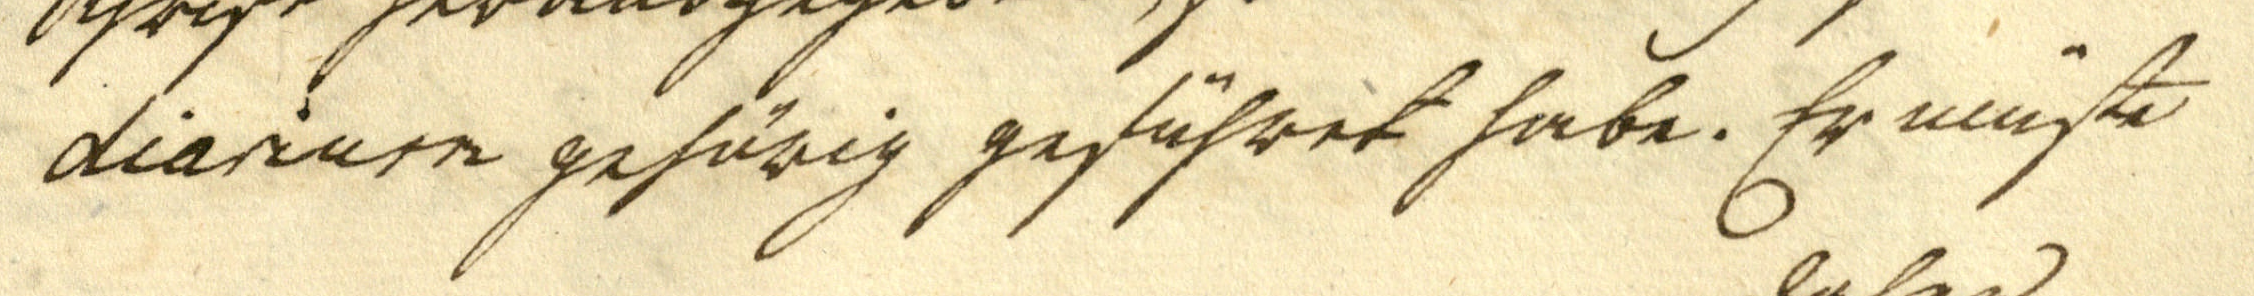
diarium gehörig geführet habe. Er müßte
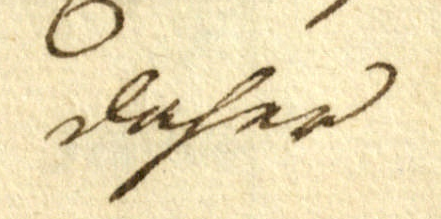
daher
